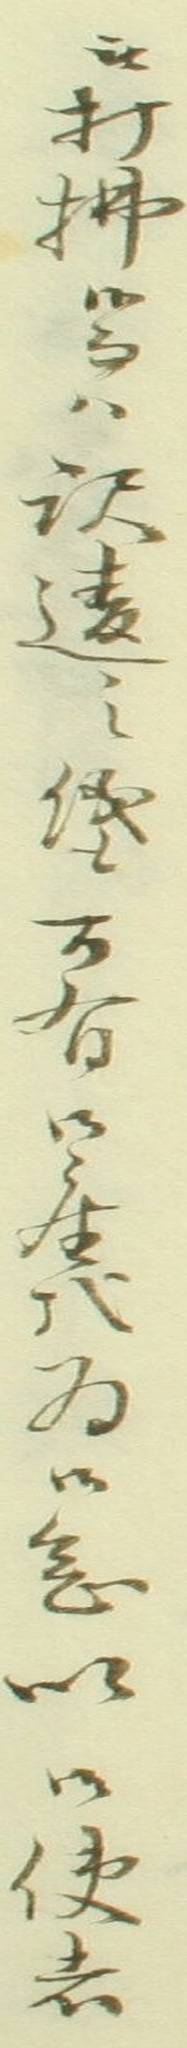被打払候而は訳違之儀も可有御座哉為念以御使者
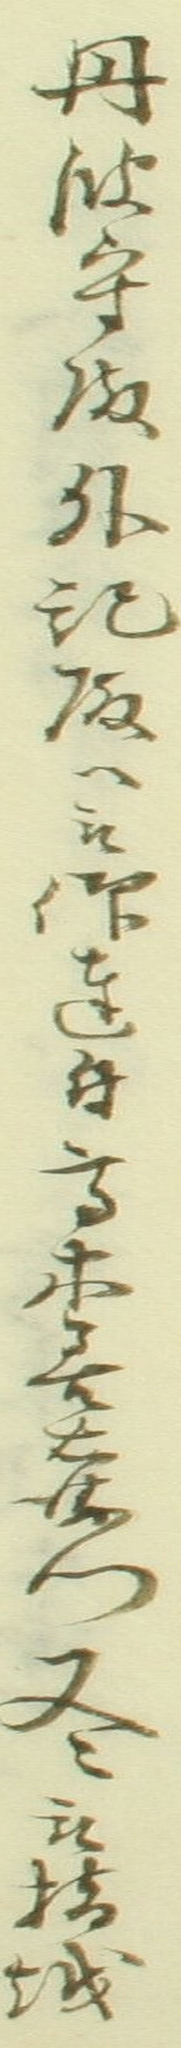丹波守殿外記殿へ被仰達付高木善右衛門又々被指越
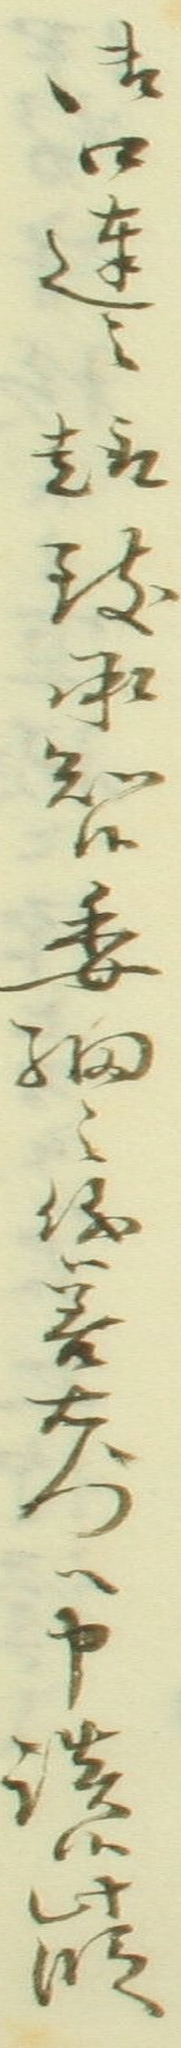御口達之趣致承知候委細之儀は善右衛門へ申談候此段

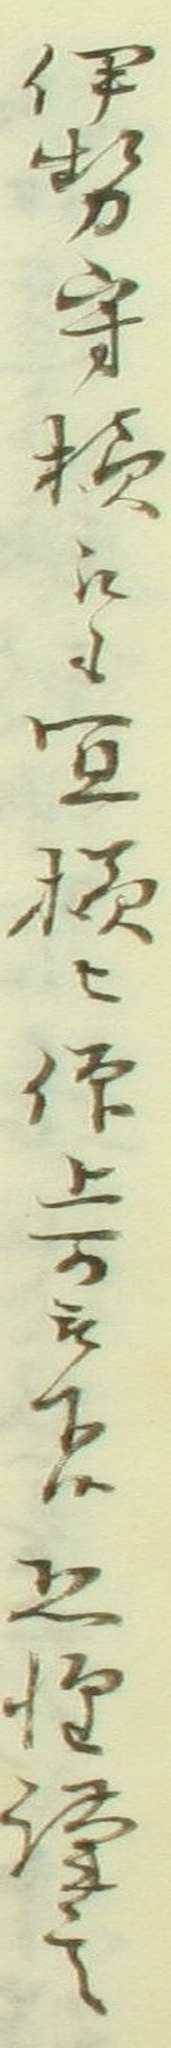伊勢守様えも宜様被仰上可被下候恐々謹言
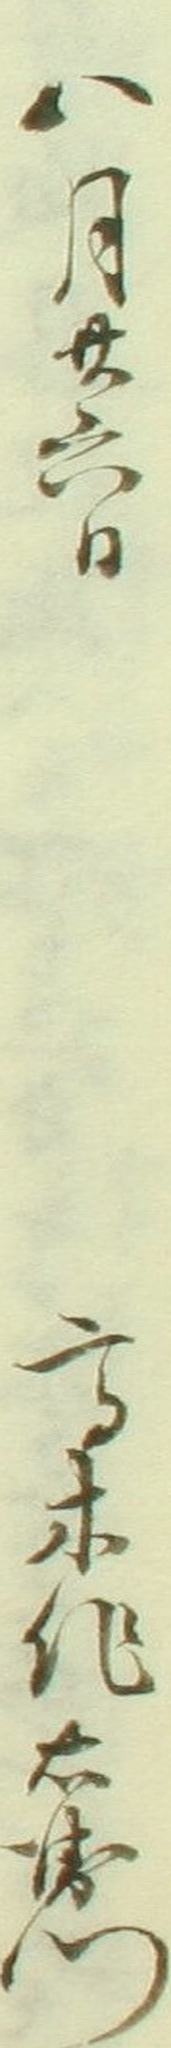八月廿六日高木作右衛門
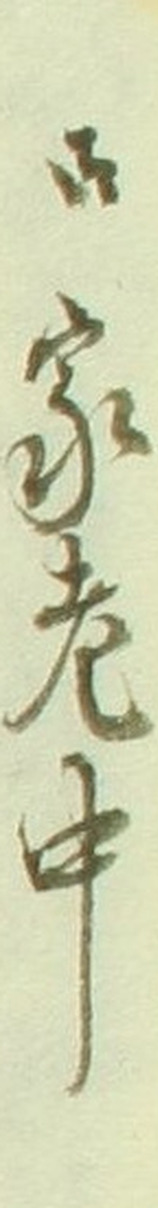御家老中
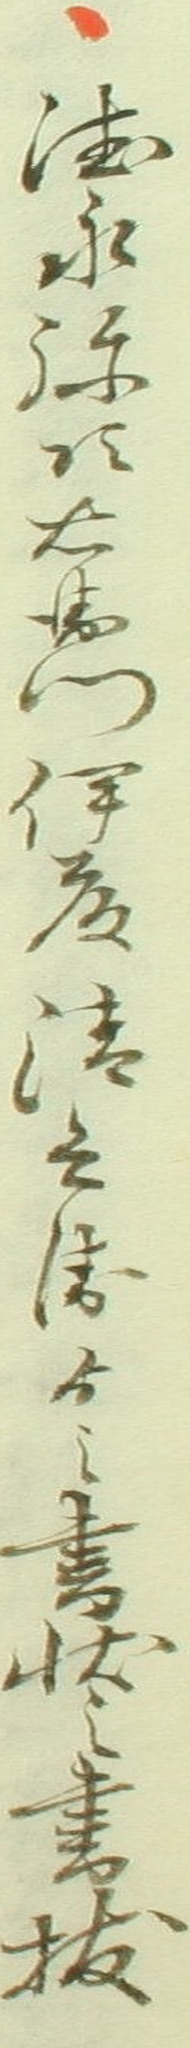徳永弥次右衛門伊藤清兵衛ゟ之書状之事抜
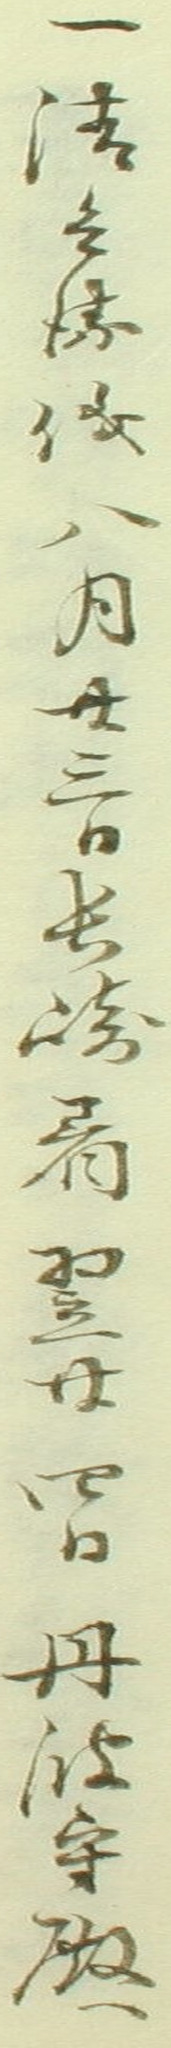一清兵衛儀八月廿三日長崎着翌廿四日丹波守殿へ
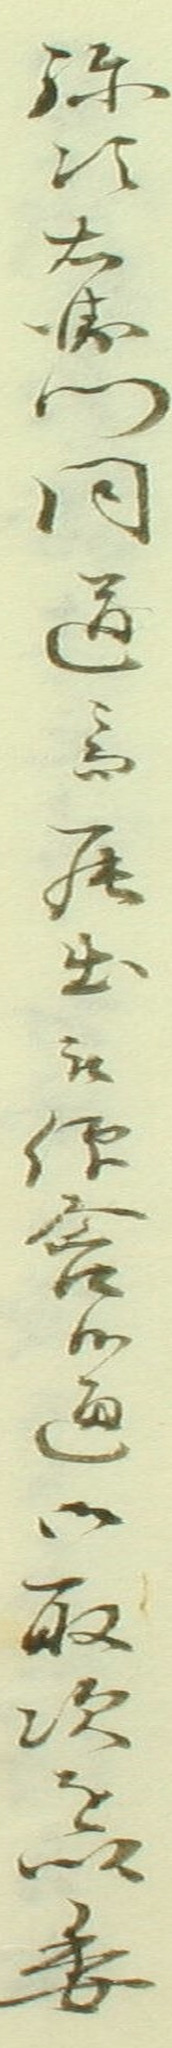弥次右衛門同道に而罷出被仰含候通御取次を以委
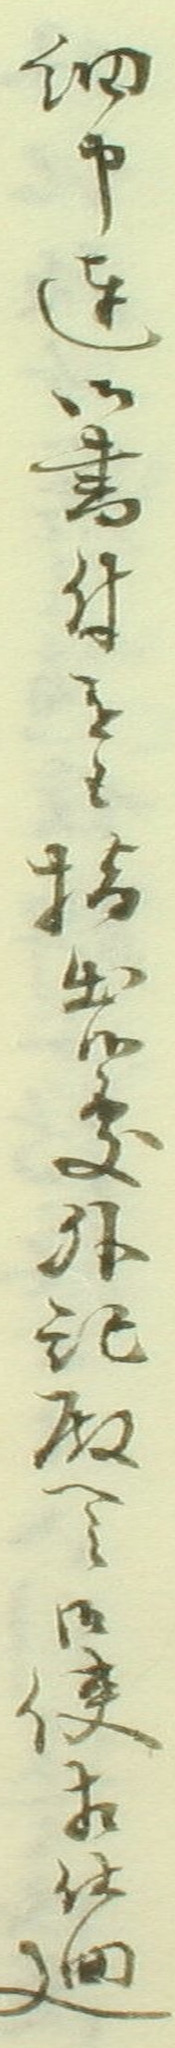細申達御書付をも指出候処外記殿へ之御使相仕廻
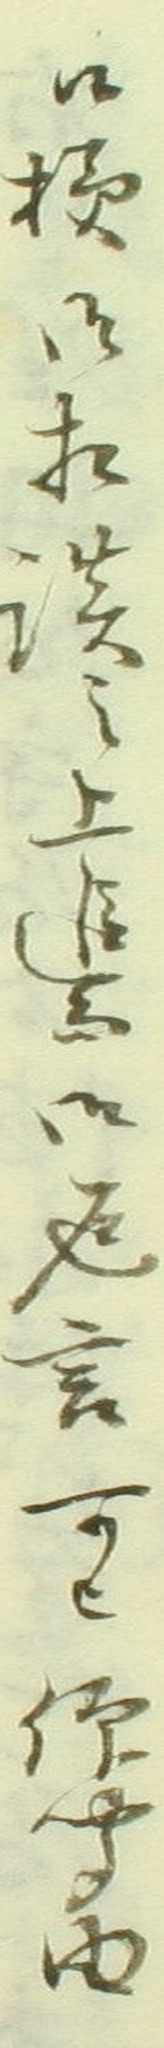候様御相談之上追而御返言可被仰聞由
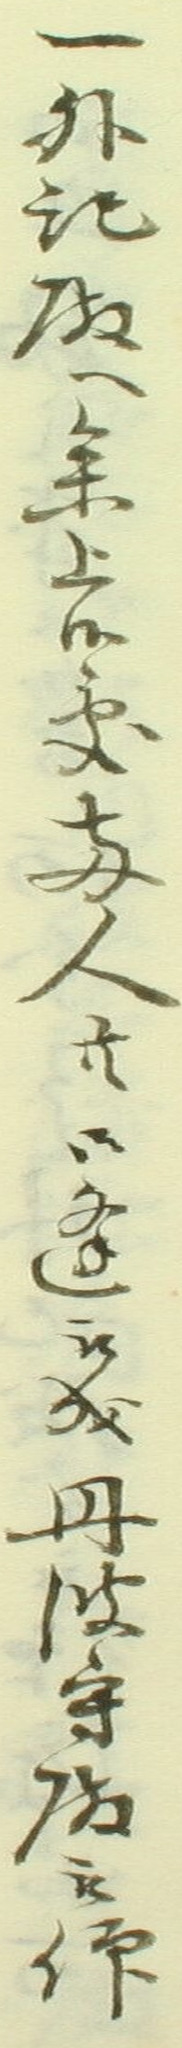一外記殿へ参上候処両人共御逢被成丹波守殿被仰
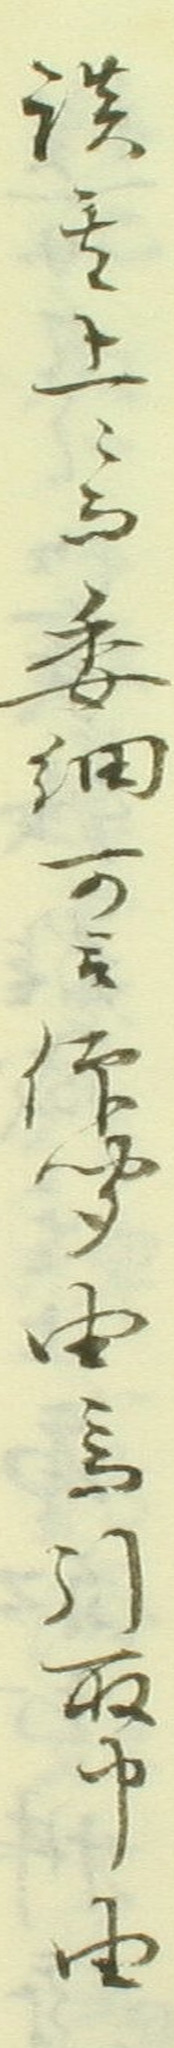談其上に而委細可被仰聞由に而引取申由
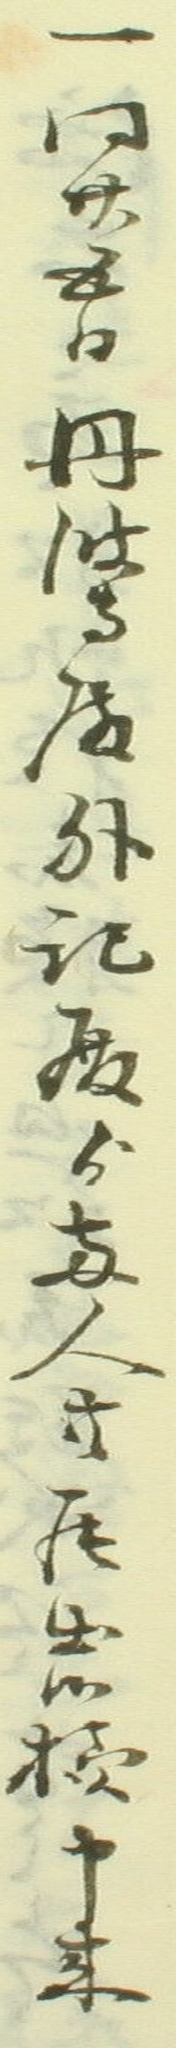一同廿五日丹波守殿外記殿ゟ両人共罷出候様申来
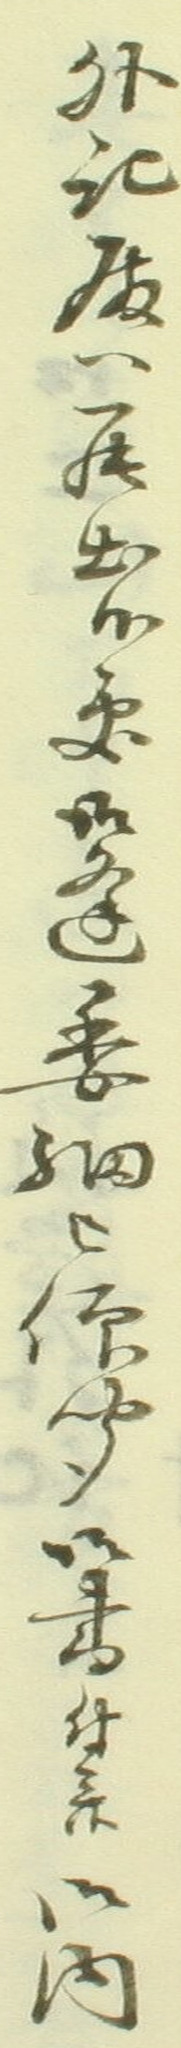外記殿へ罷出候処御逢委細被仰聞御書付并御内
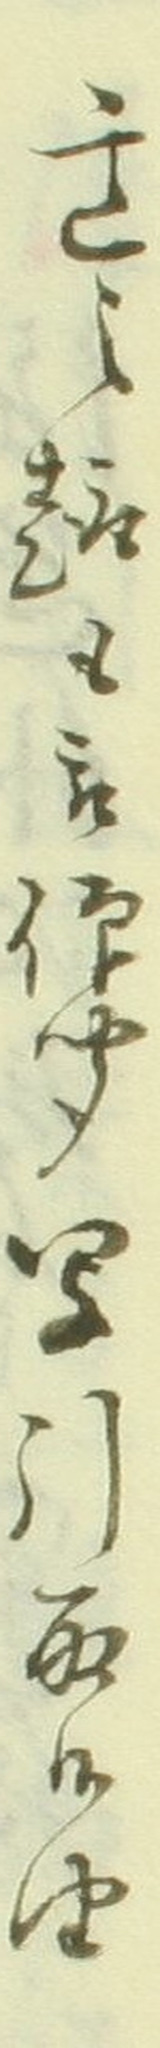意之趣も被仰聞写引取候由
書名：異国船漂着記
